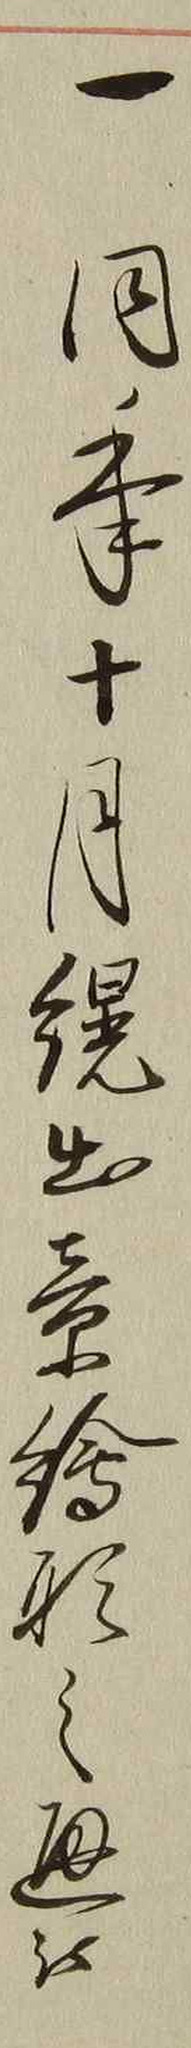一同年十月縨出景絵形之通被
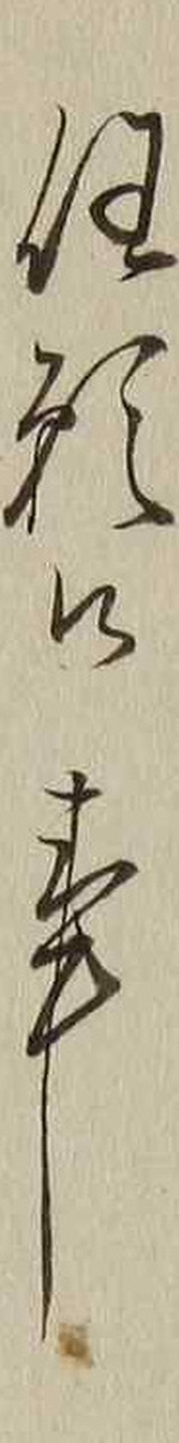任願候事
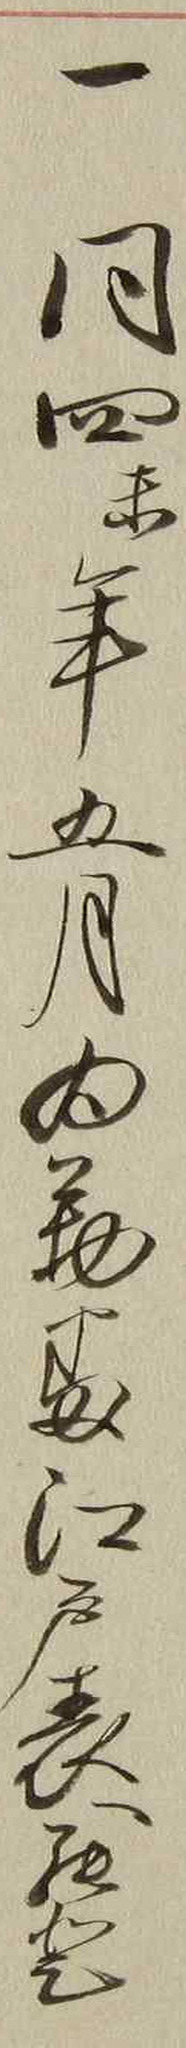一同四末年五月為勤番江戸表へ罷登
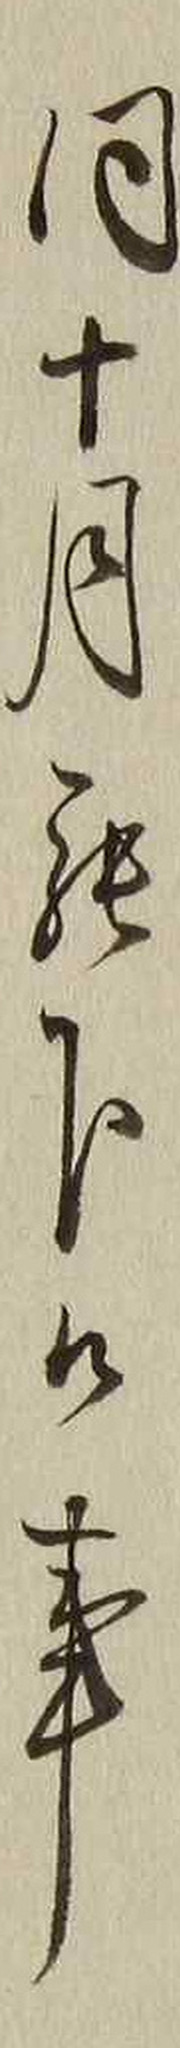同十月罷下候事
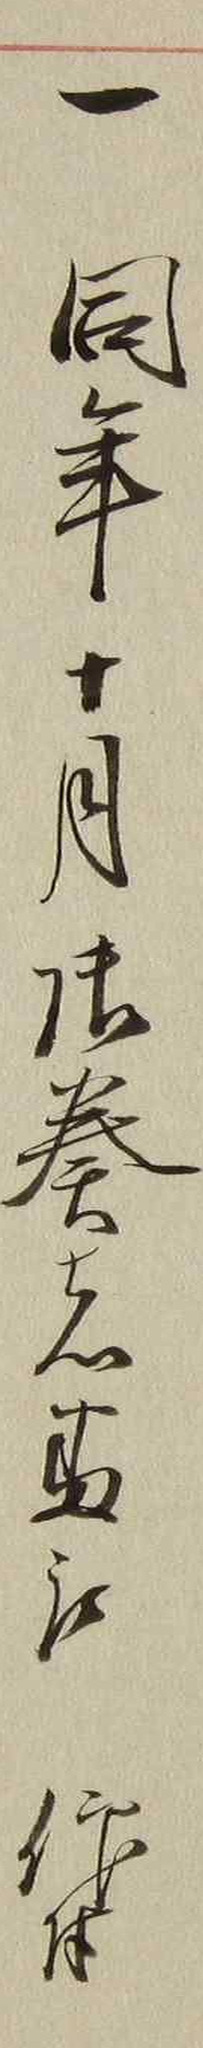一同年十月御奏者番被仰付
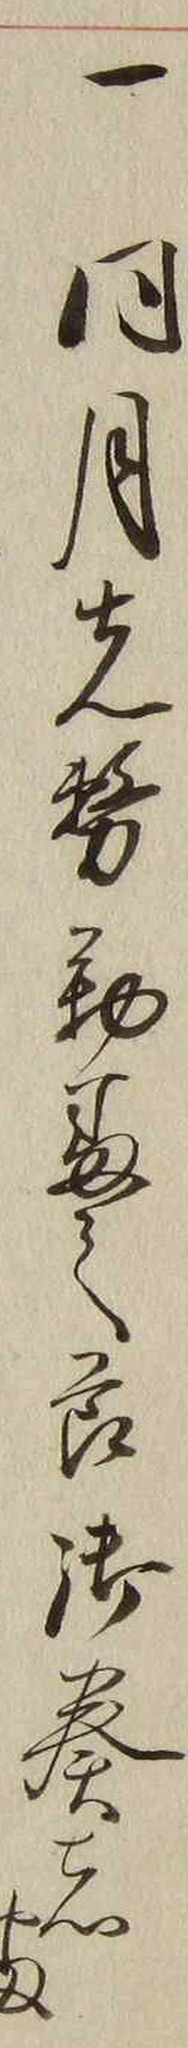一同月先務勤番之節御奏者番
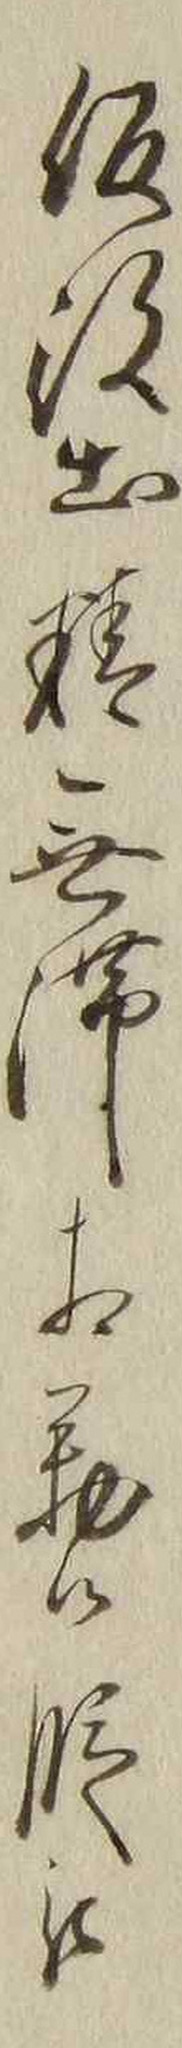仮役出精無滞相勤候段被
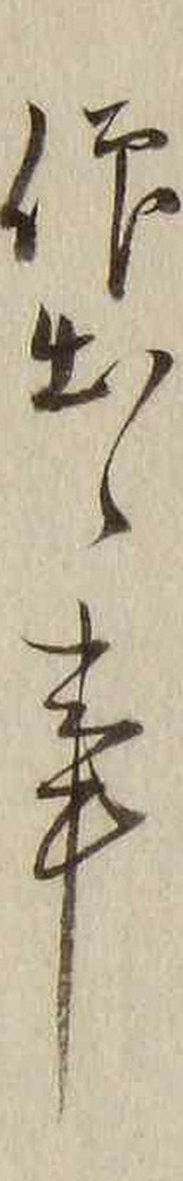仰出候事
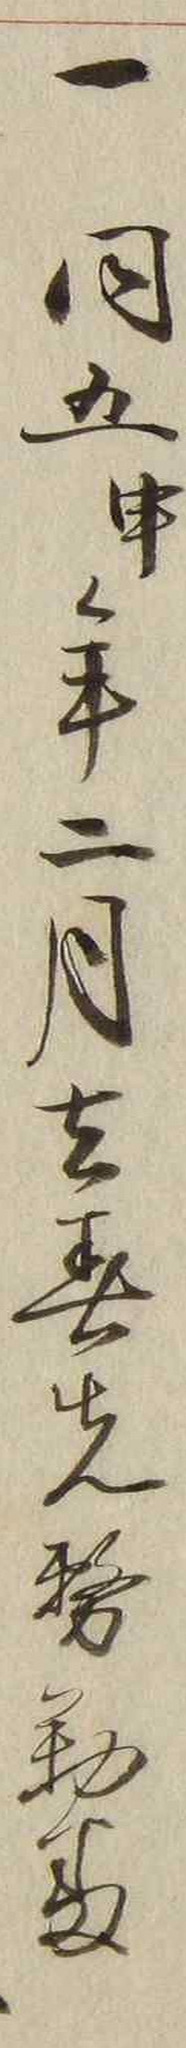一同五申年二月去春先務勤番

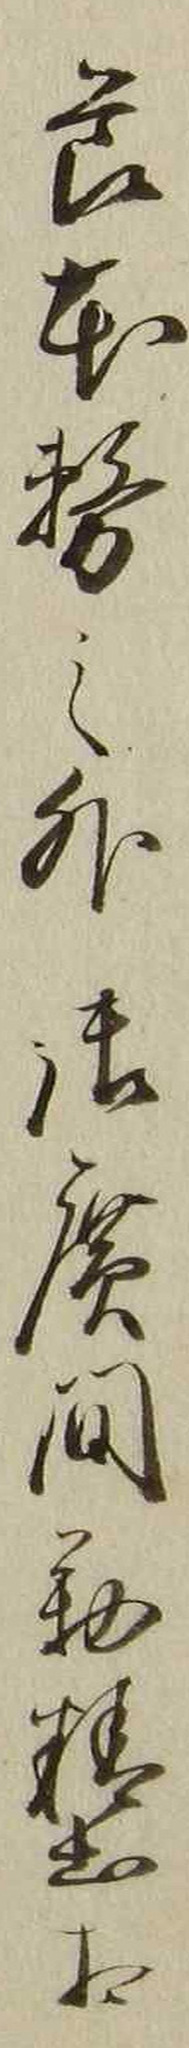節本務之外御広間勤精出相
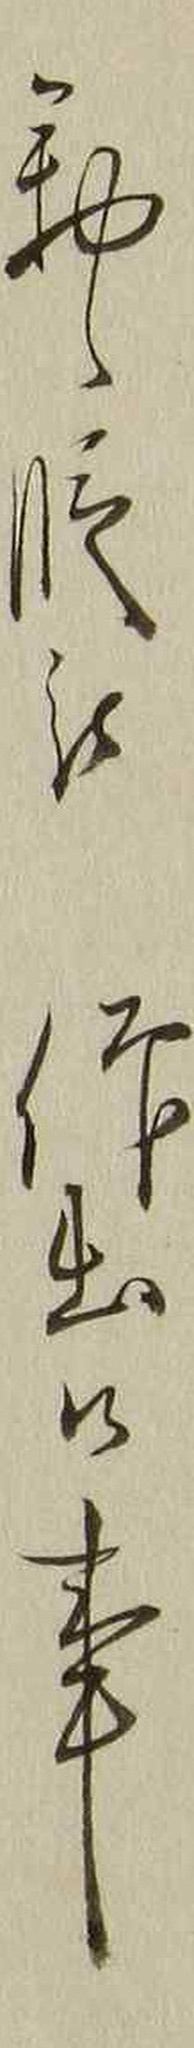勤候段被仰出候事
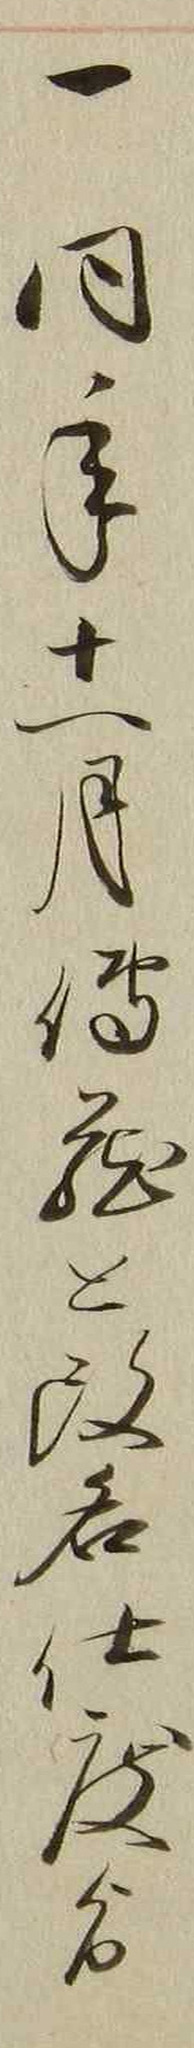一同年十一月伝蔵と改名仕度旨
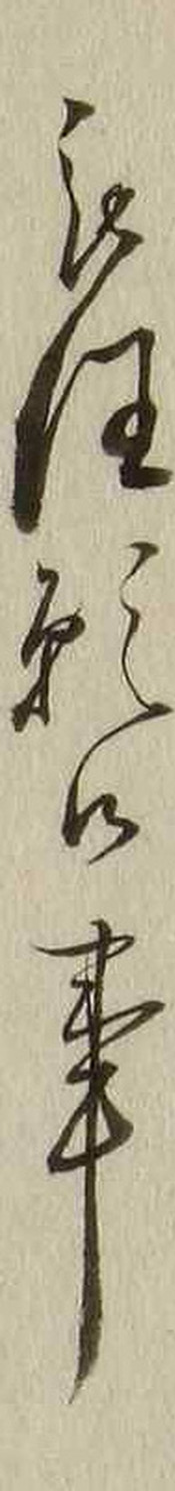被任願候事
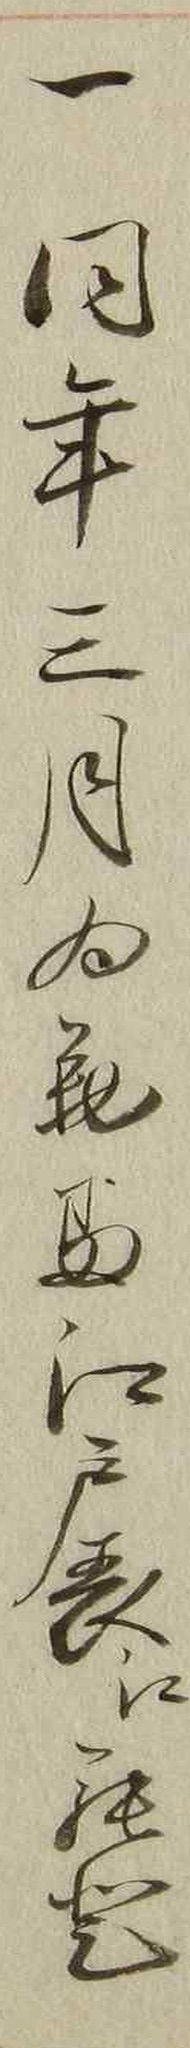一同年三月為勤番江戸江罷登
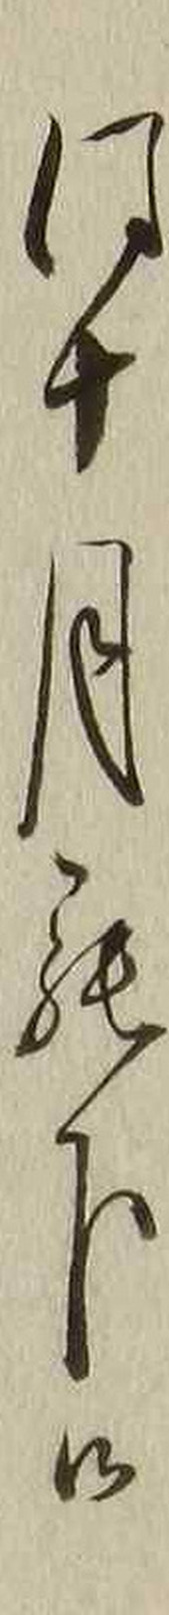同十月罷下候事
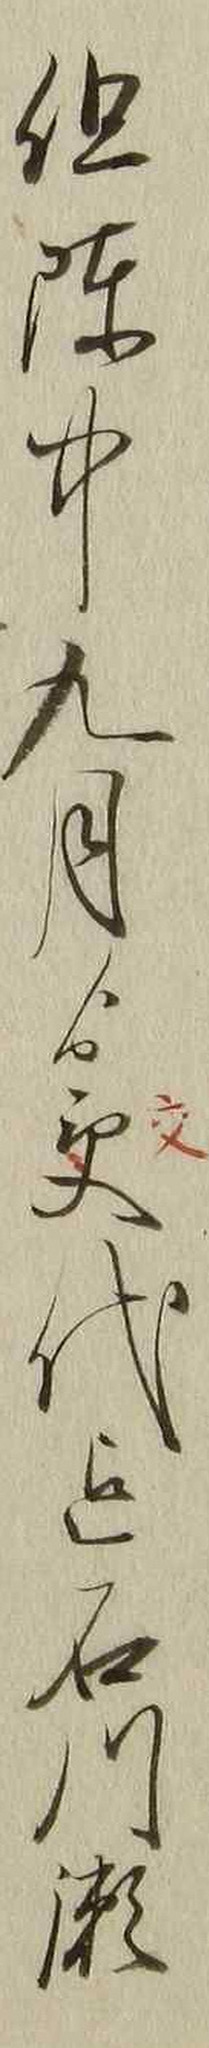但陳中九月ゟ更代迄石川瀬
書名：諸士系譜　巻之103　か之部11
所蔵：会津若松市立会津図書館
